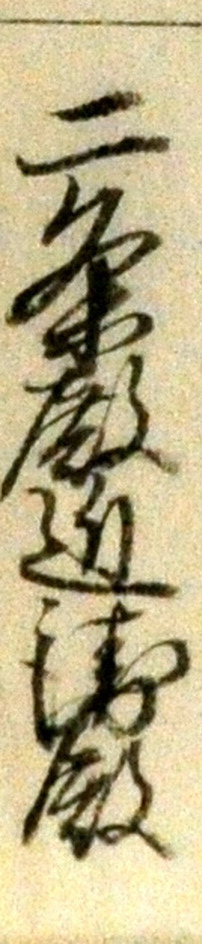二条殿近衛殿
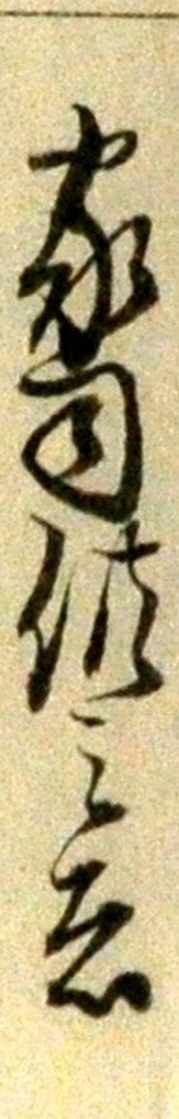家司供之者
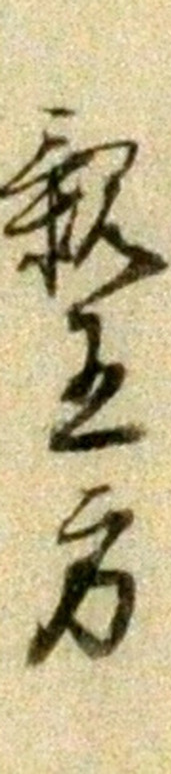親王方
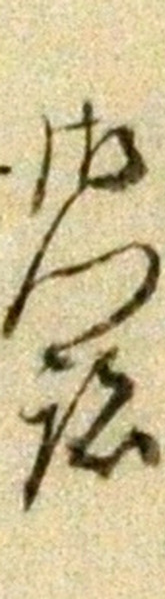御門跡
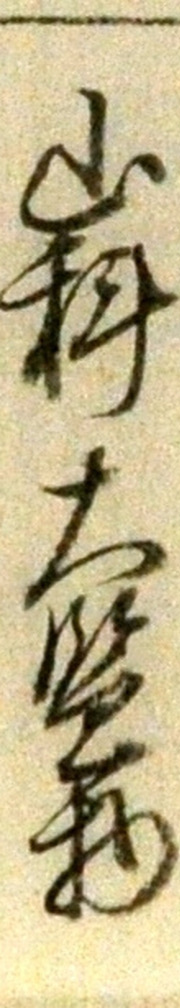山科大監物
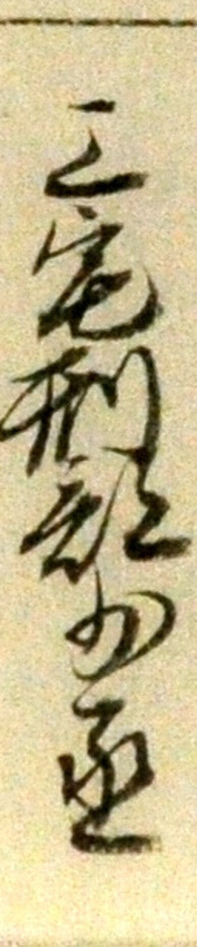三宅刑部少丞
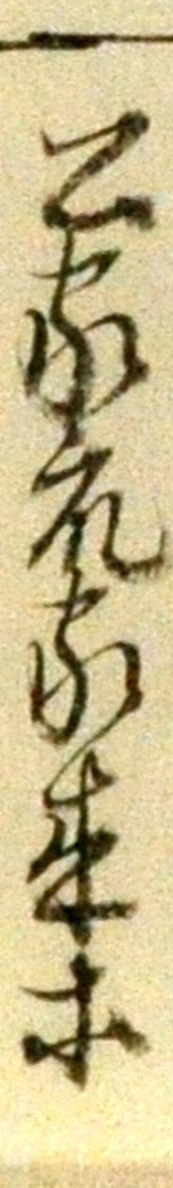公家衆家来等

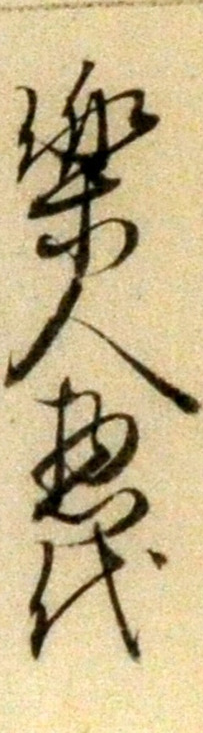楽人惣代
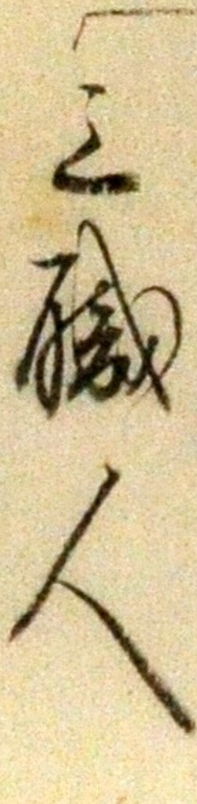三職人
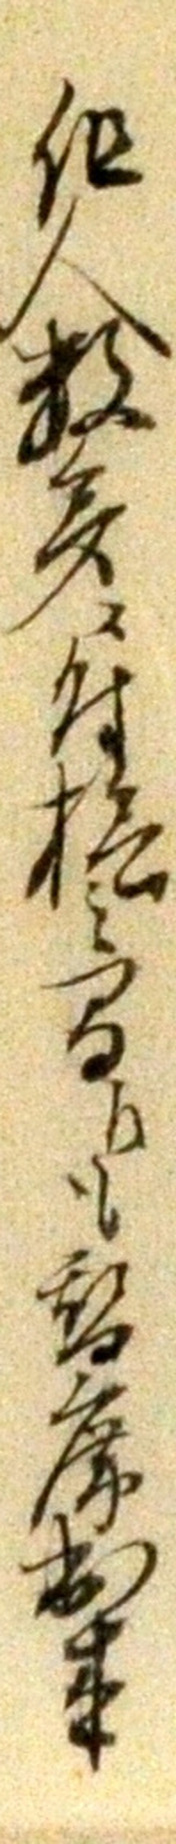但人数多ニ付桧之間えも替席出来
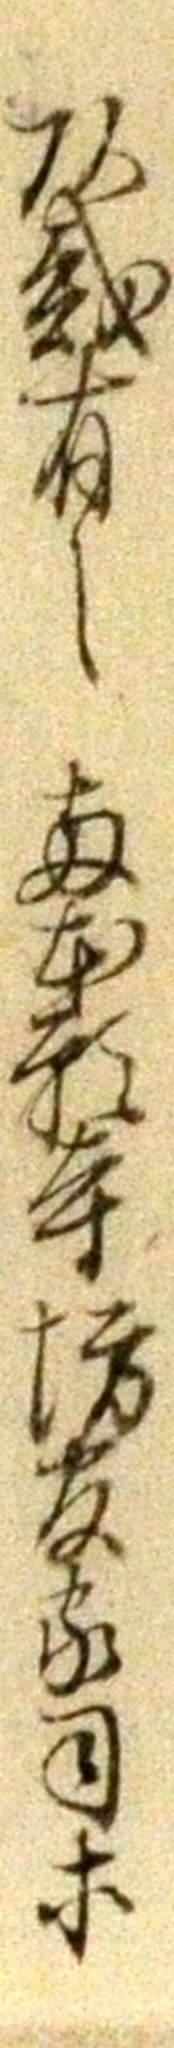頂戴有之両本願寺坊官家司等
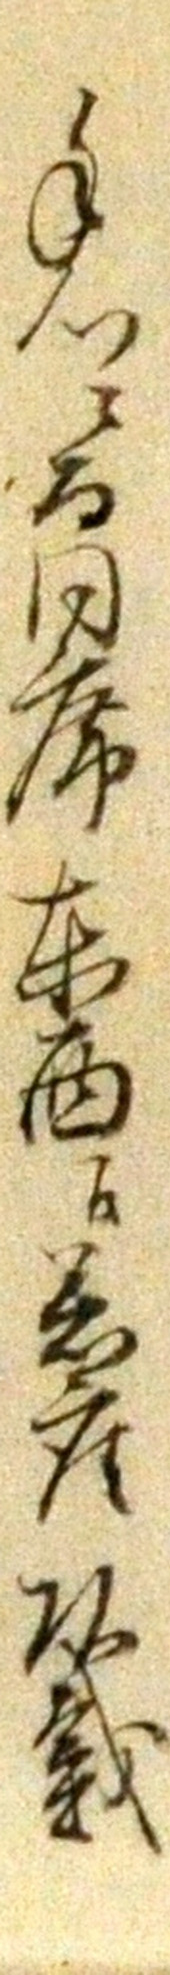手心ニ而同席東西え着座頂戴
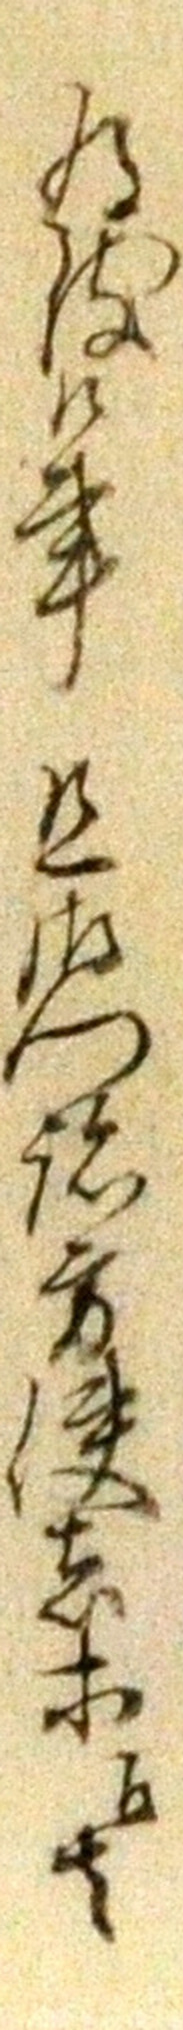為致候事且御門跡方使者等えは
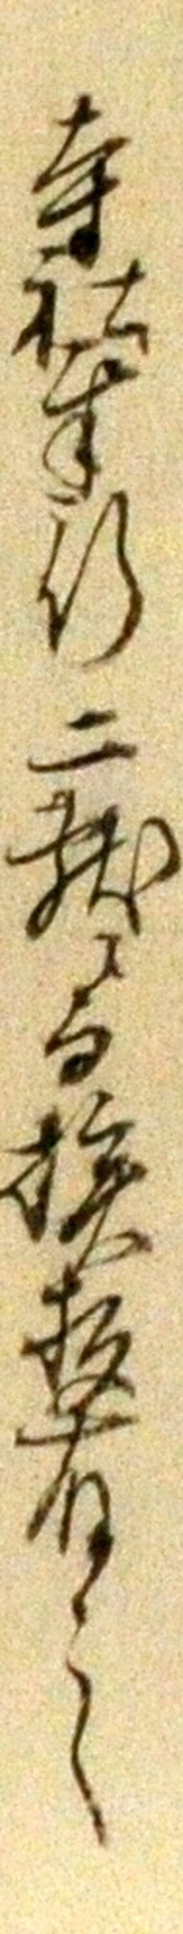寺社奉行二献ニ而挨拶有之
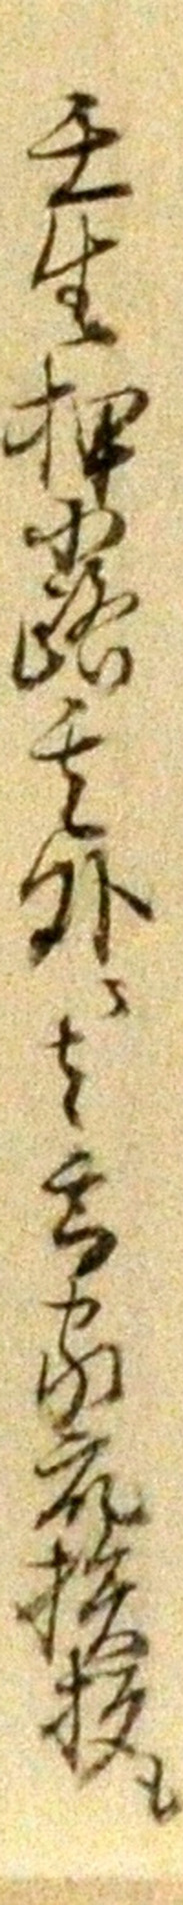壬生押小路其外には高家衆挨拶も
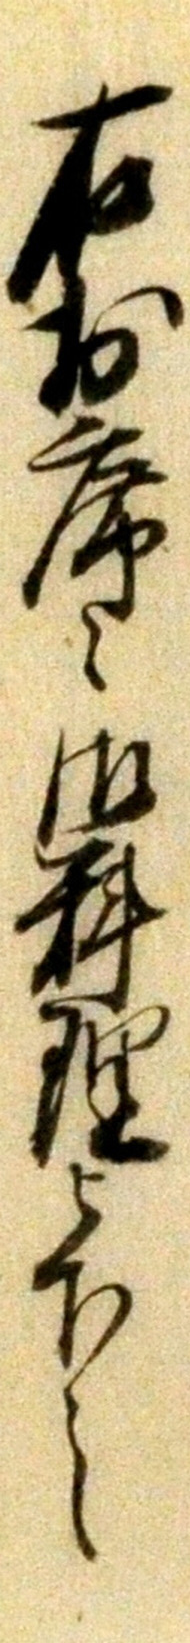右於席々御料理被下之
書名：御馳走御能ノ節ノ留外
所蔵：伊那市立高遠町図書館・合同会社AMANE
